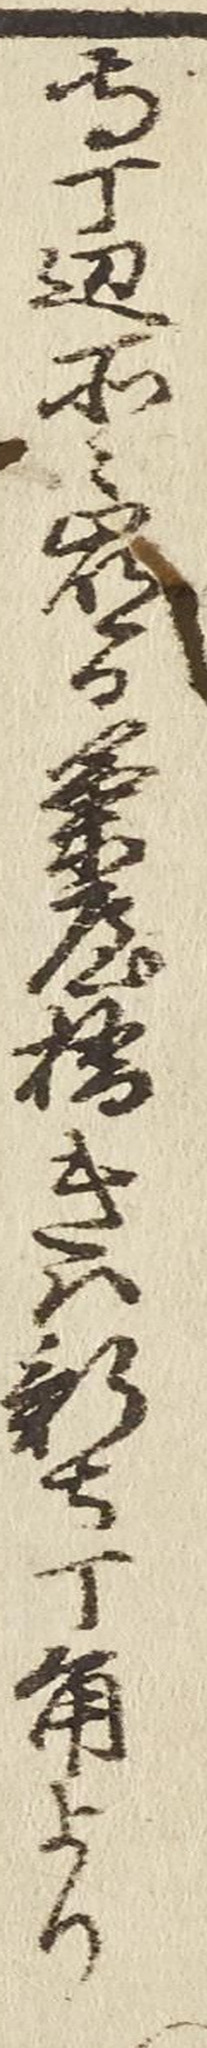寺丁辺所々崩る茶屋橋きは新寺丁角より
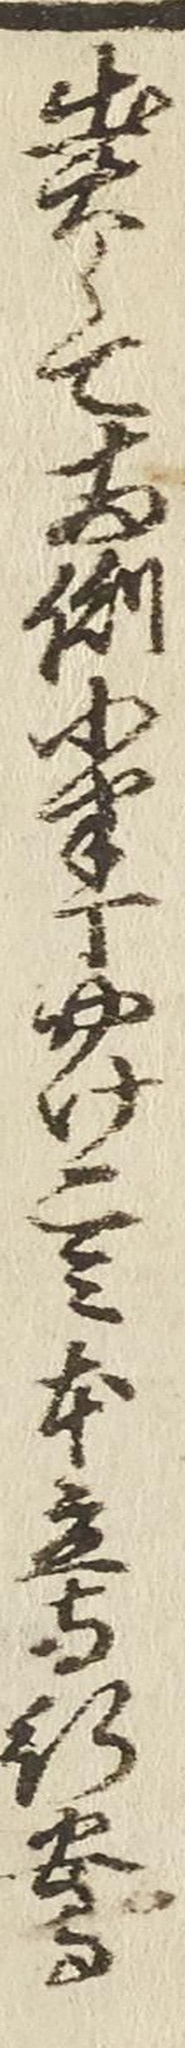出火して両側小半丁やけこみ本立寺行安寺
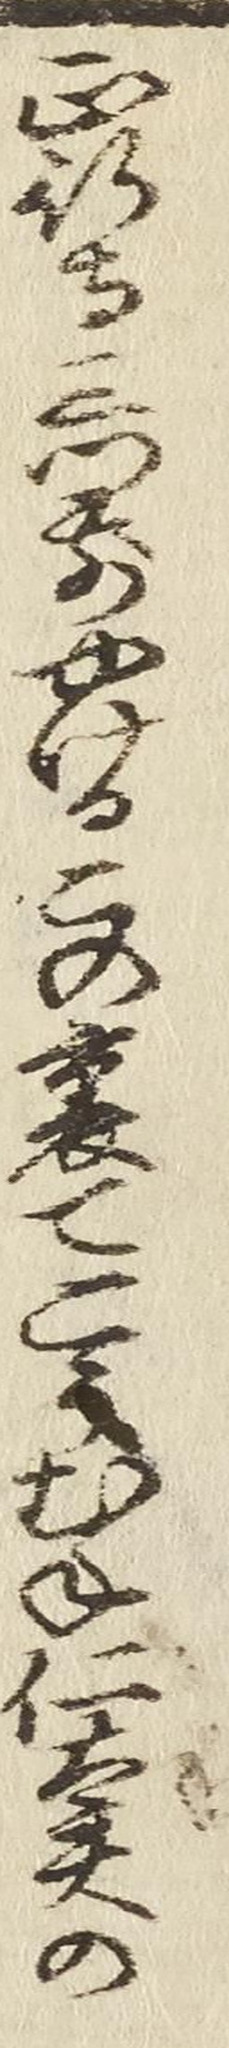正行寺三門前やけるこの裏てこうむね仁太夫の
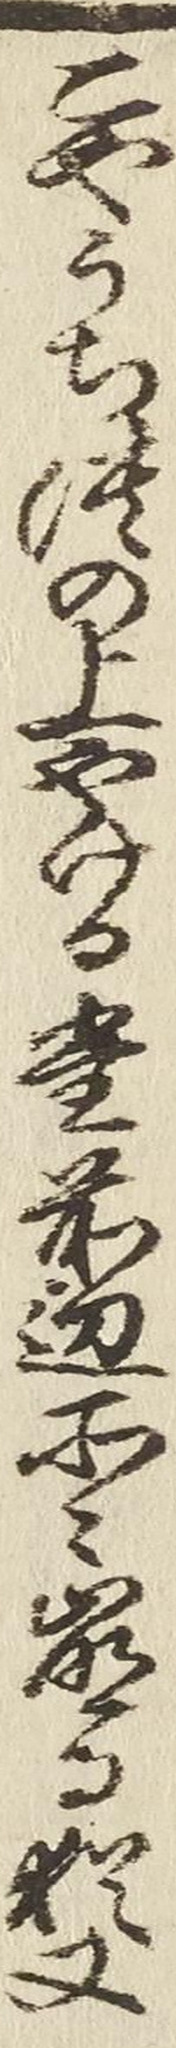こやうち潰の上やける堂前辺所々崩る猶又
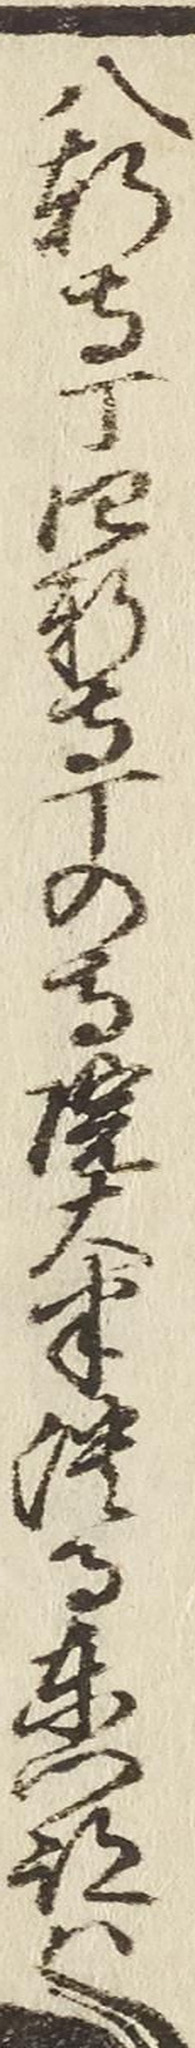八軒寺丁四軒寺丁の寺院大半潰る東門跡は
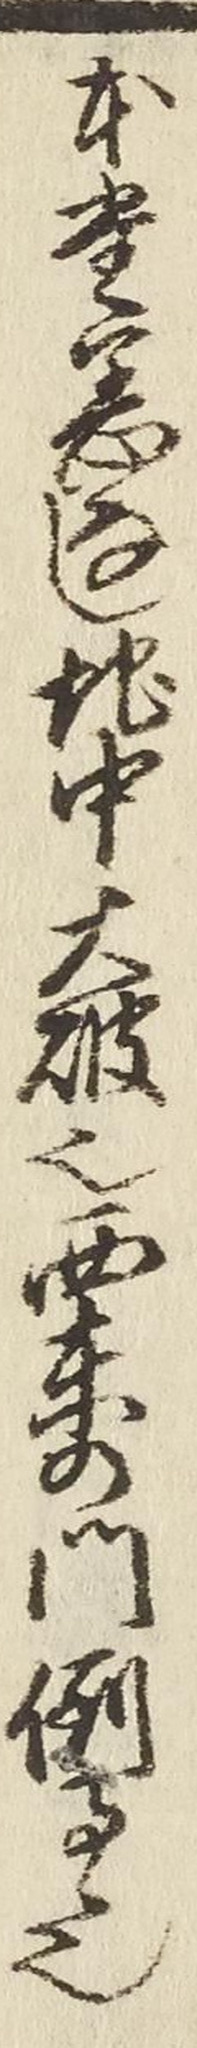本堂恙なし地中大破也西東の門倒るゝ也
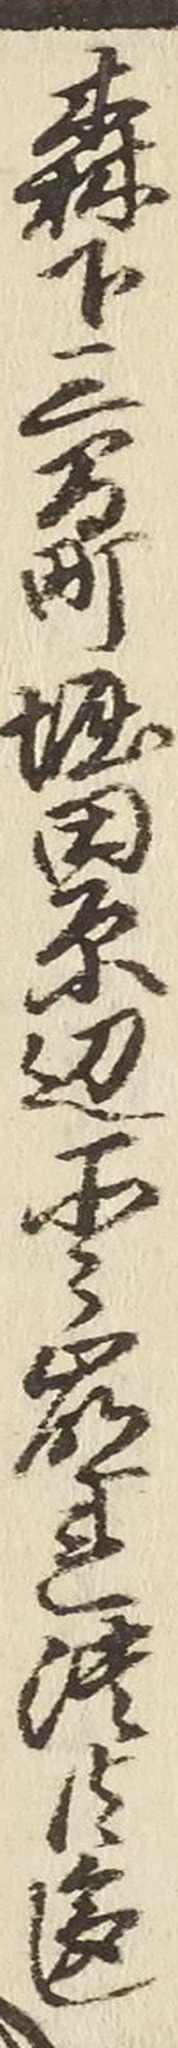森下三間町堀田原辺所々崩れ潰共多し
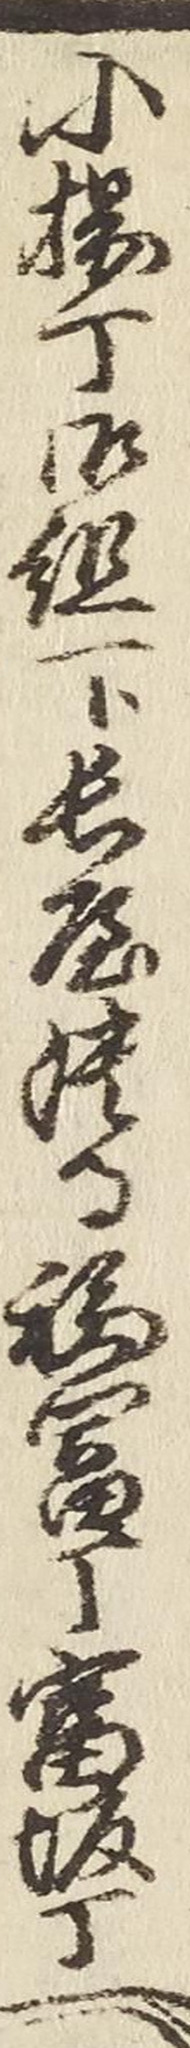小揚丁御組下長屋潰る福富丁富坂丁
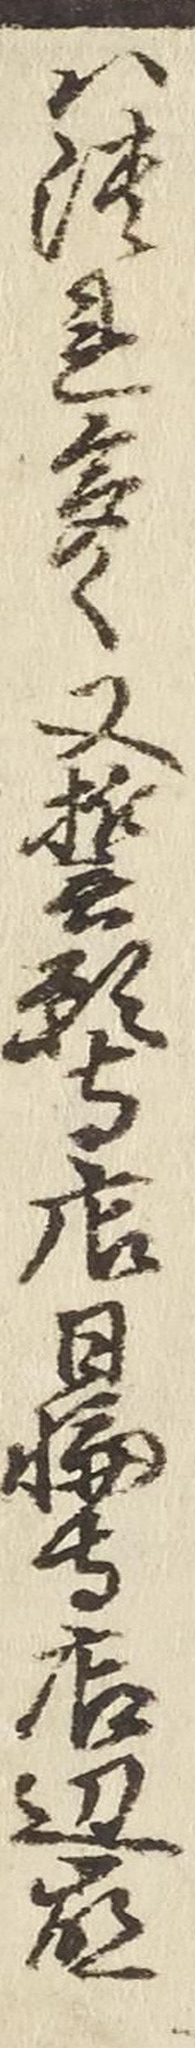は潰れ多く又誓願寺店日輪寺店辺崩
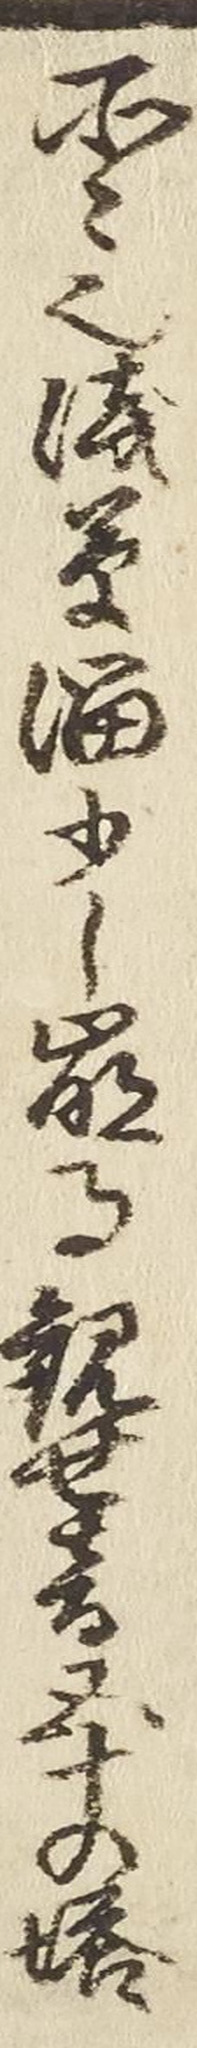所々也浅草溜少し崩る観世音五十の塔
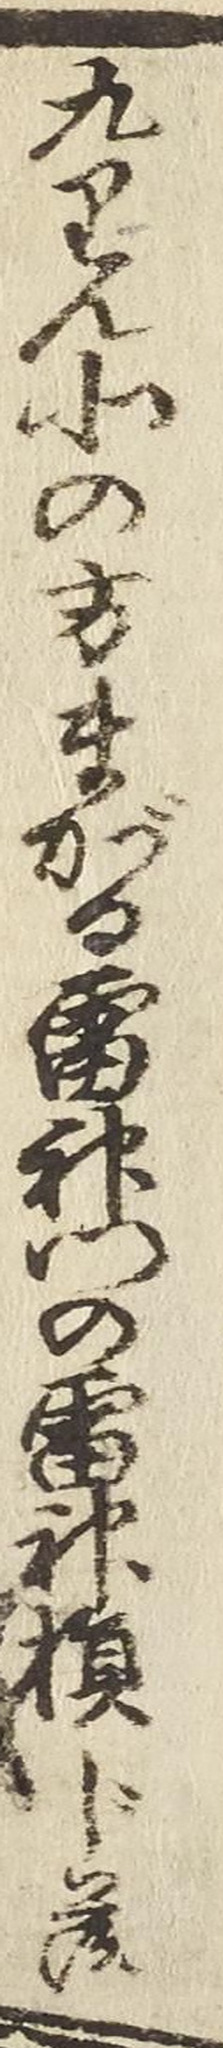九りん北の方まがる雷神門の雷神損じ落

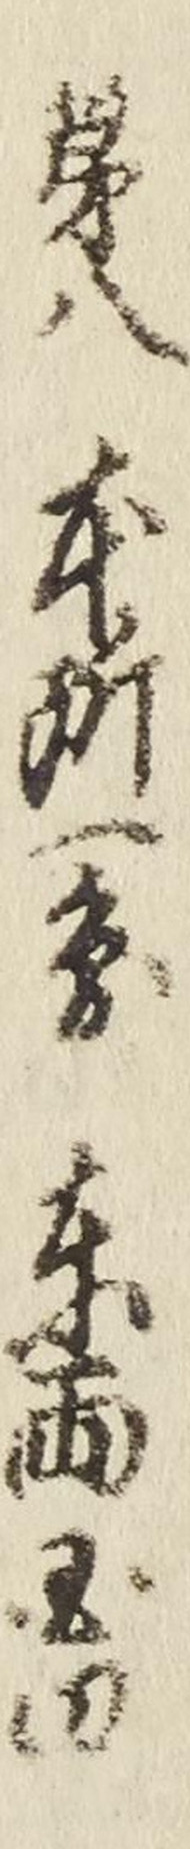第八本所一円東両国
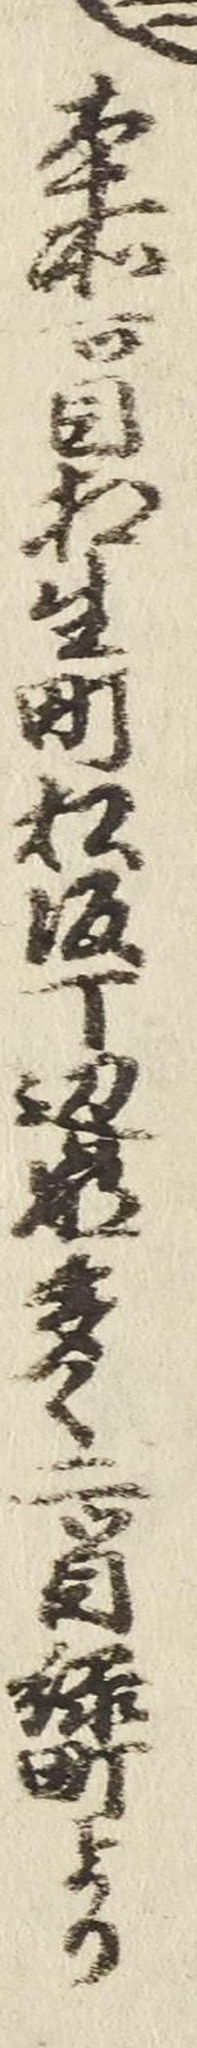本所一ツ目相生町松坂丁辺崩多く二ツ目緑町より
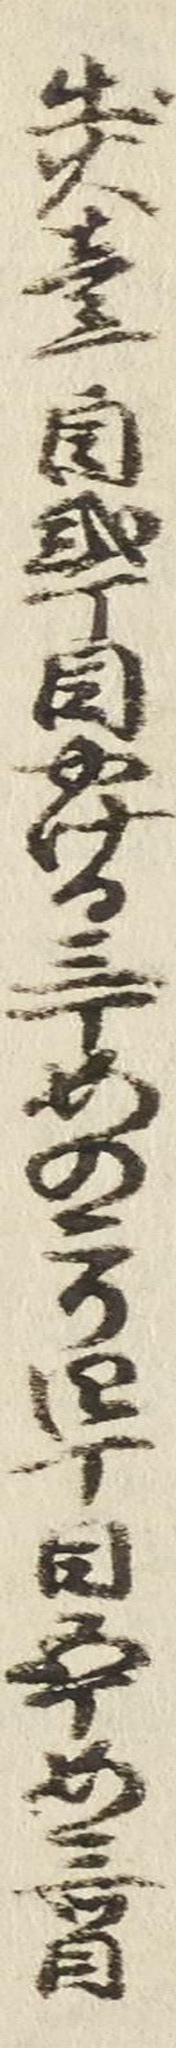出火壱丁目弐丁目やける三丁めのこり四丁目五丁め三ツ目
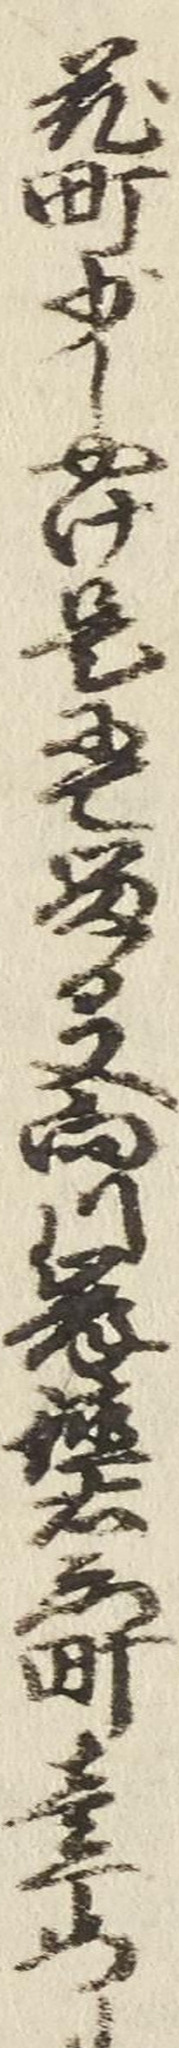花町少しやけ是にて留る又向川岸徳右衛門町壱丁め
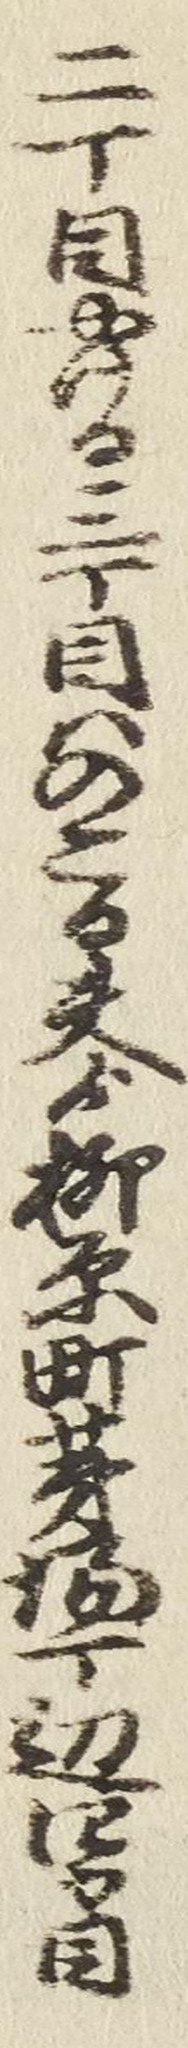二丁目やける三丁目はのこる夫ゟ柳原町茅場丁辺四ツ目
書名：江戸みやげ
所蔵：東京大学地震研究所図書室 Earthquake Research Institute Library, The University of Tokyo, JAPAN
